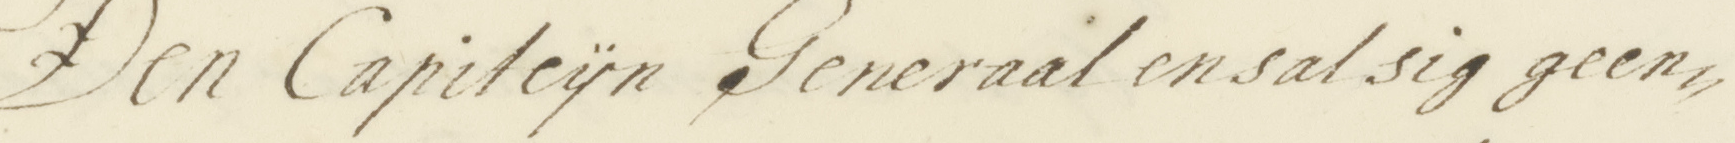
Den Capiteijn Generaal en sal sig geen,,
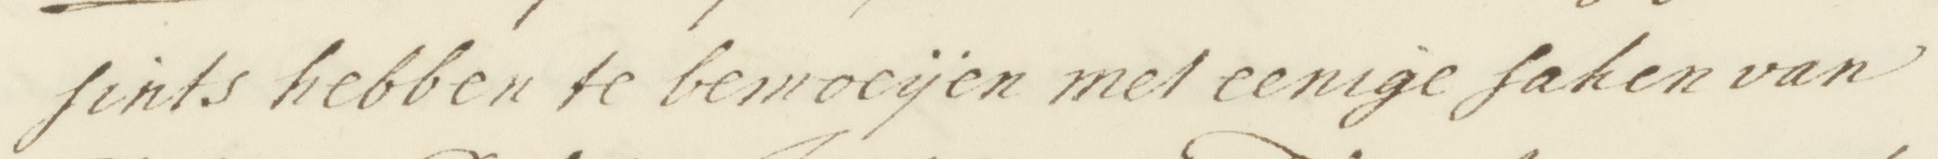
sints hebben te bemoeijen met eenige saken van
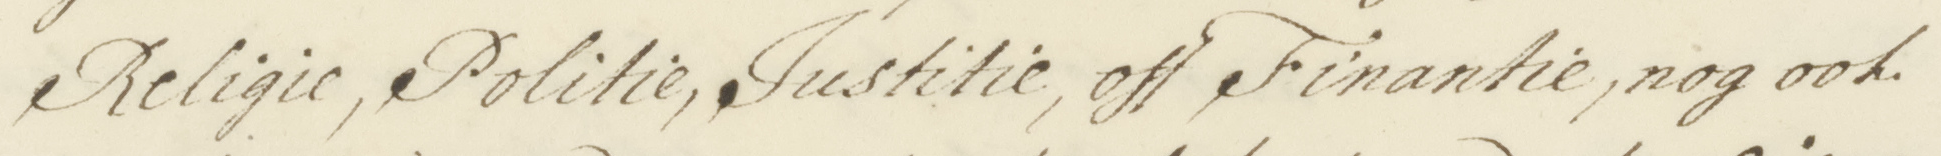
Religie, Politie, Justitie, oft Finantie, nog ook
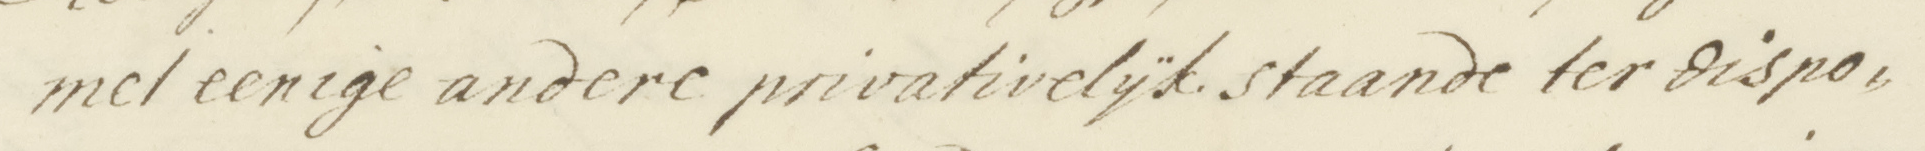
met eenige andere privativelijk staande ter dispo,,
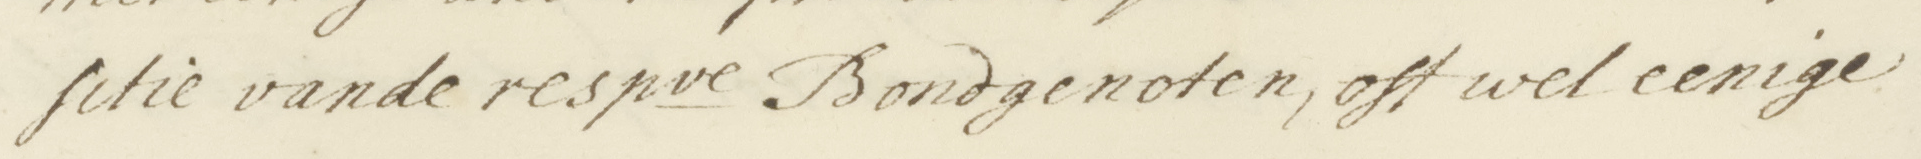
sitie vande respve Bondgenoten, oft wel eenige
